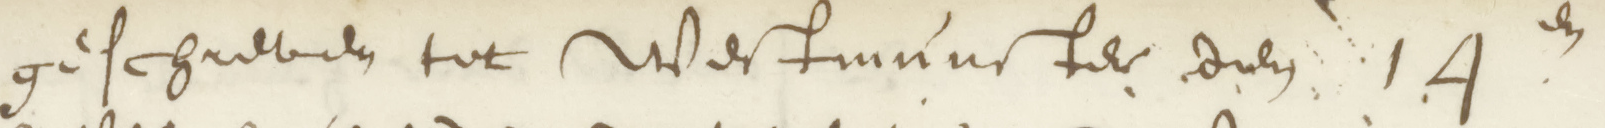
geschreven tot Westminster den 14en
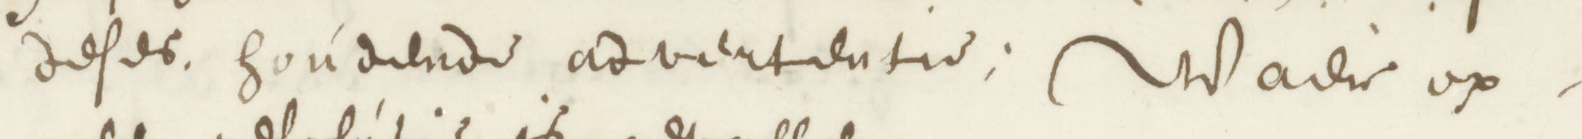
deses houdende advertentie: Waer op
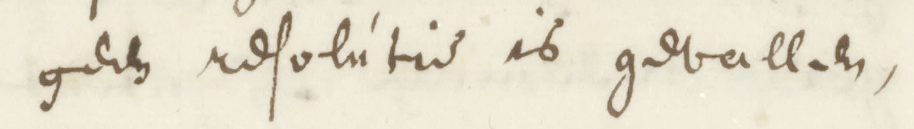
geen resolutie is gevallen.
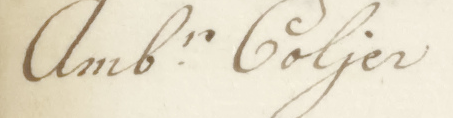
Ambr Coljer
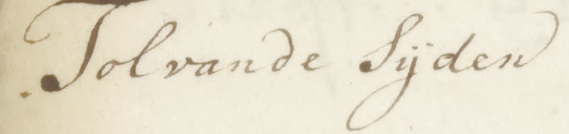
Tol vande Sijden
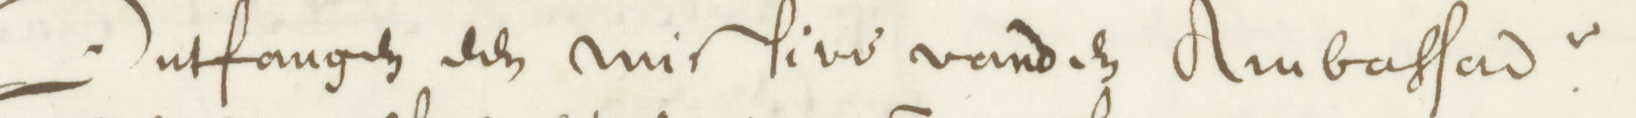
Ontfangen een missive vanden Ambassadr.
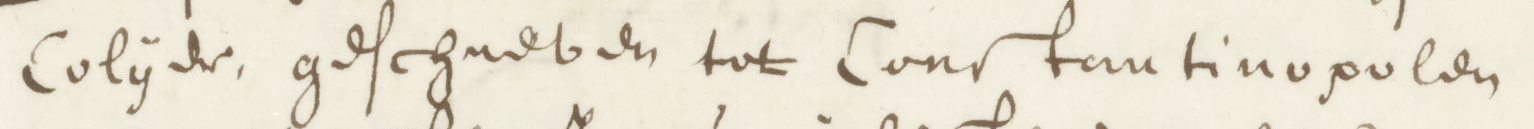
Colijer, geschreven tot Constantinopolen
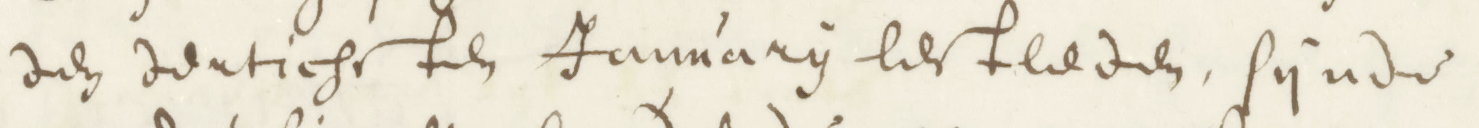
den dertichsten Januarij lestleden, sijnde
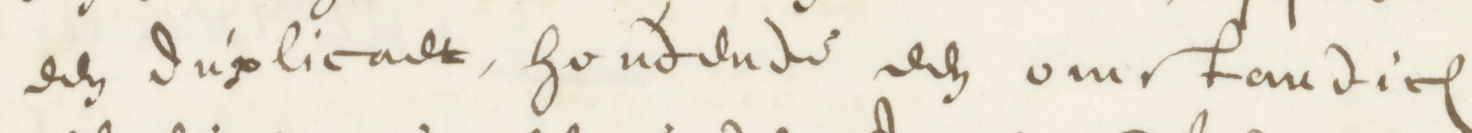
een duplicaet, houdende een omstandich
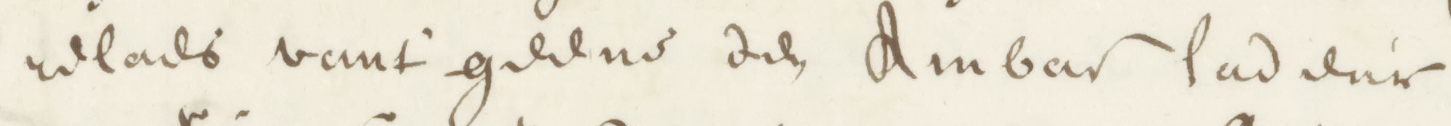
relaes vant geene den Ambassadeur
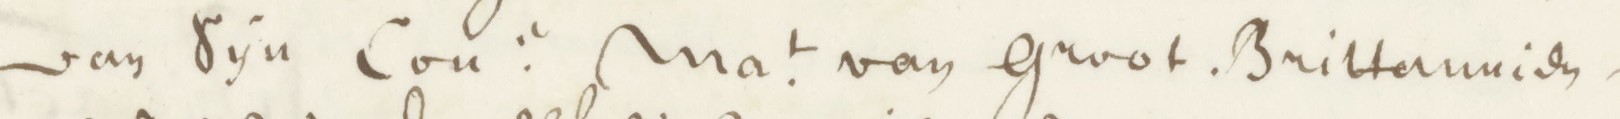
van Sijn Cone. Mat. van Groot Brittanien
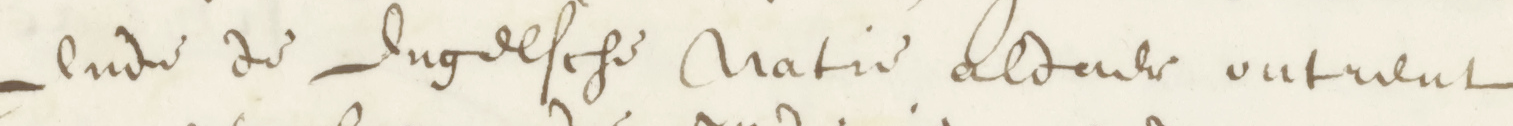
ende de Engelsche natie aldaer ontrent
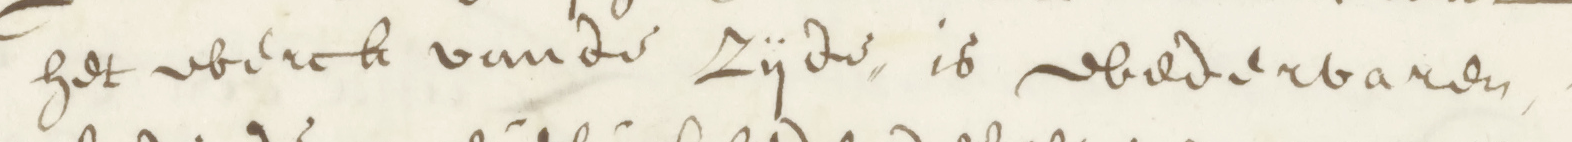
het werck vande Zijde is wedervaren
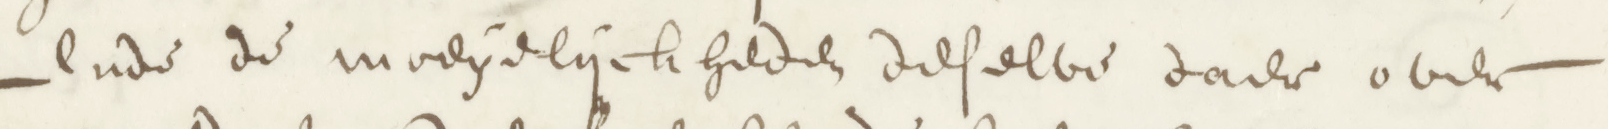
ende de moeijelijckheden deselve daer over
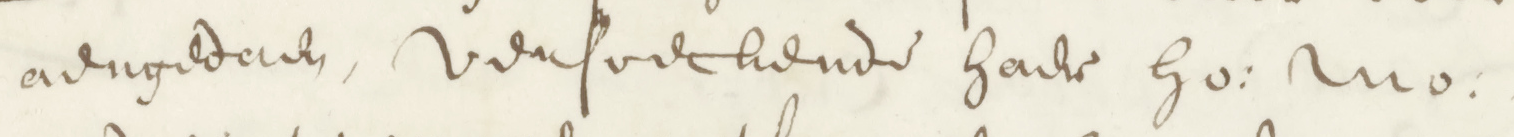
aengedaen, versoeckende haer Ho:Mo:
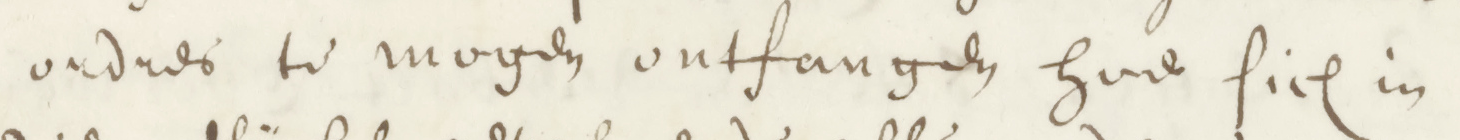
ordres te mogen ontfangen hoe sich in
